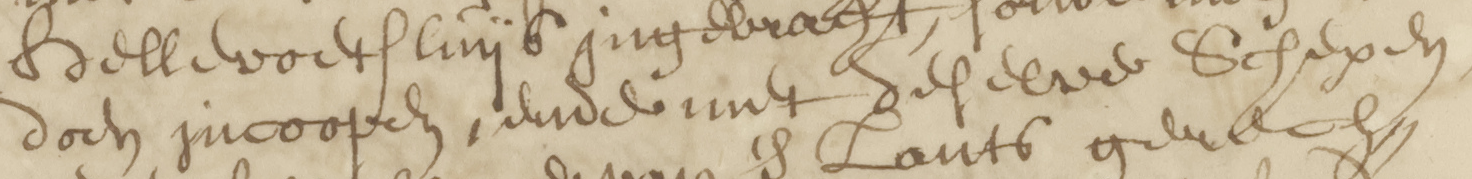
doen incoopen, ende met deselve Schepen
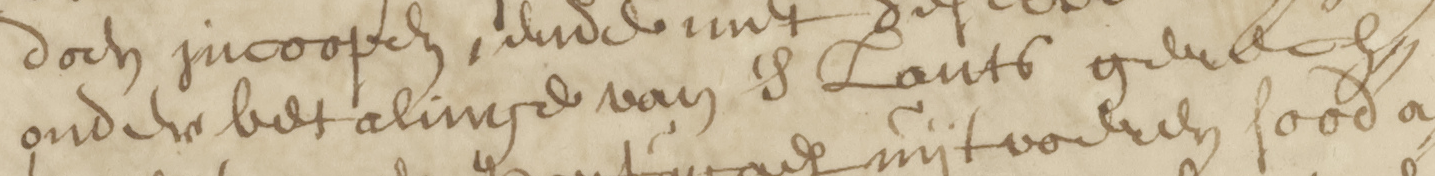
onder betalinge van ‛s Lants gerech,
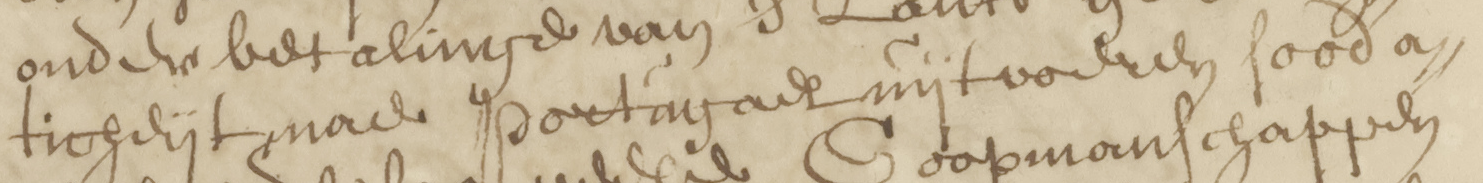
ticheijt, nae Portagael uijtvoeren sooda„
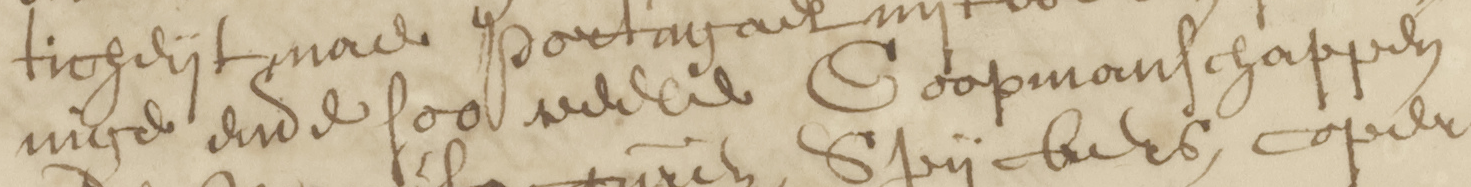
nige ende soo veele Coopmanschappen
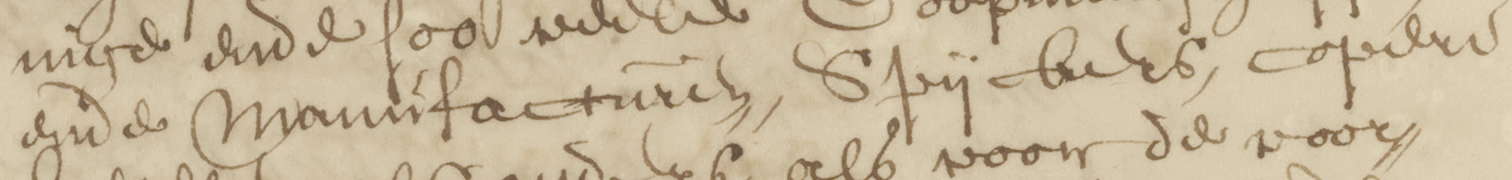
ende manifacturen, Spijckers, copere
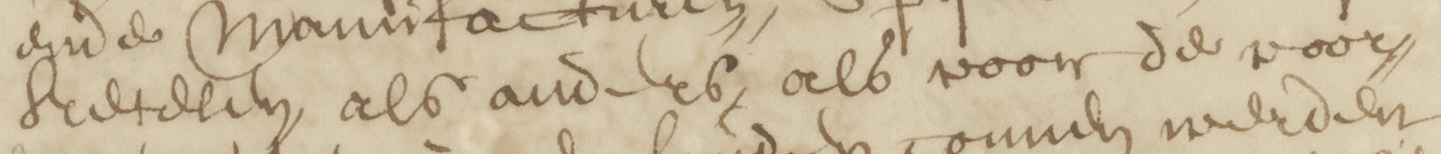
ketelen, als anders, als voor de voor„
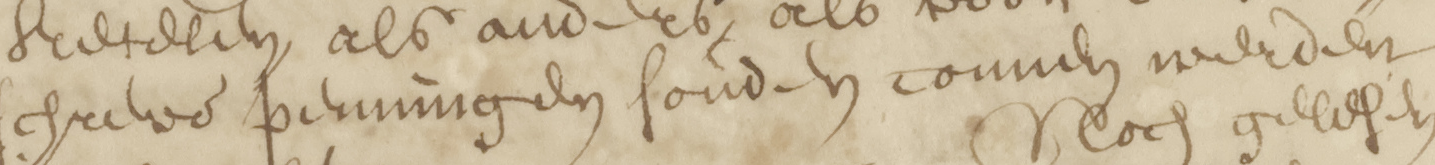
schreve penningen souden connen werden
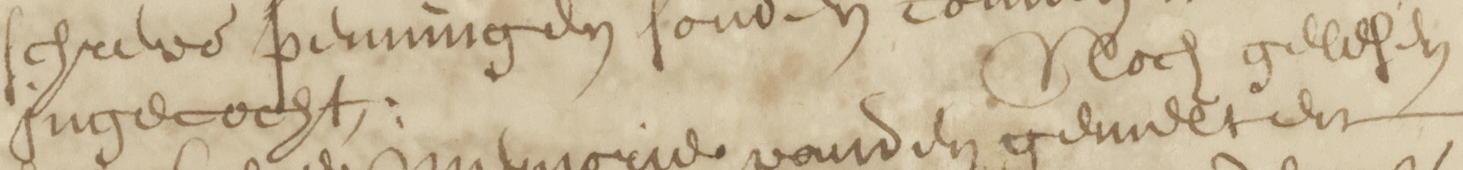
ingecocht,: Noch gelesen
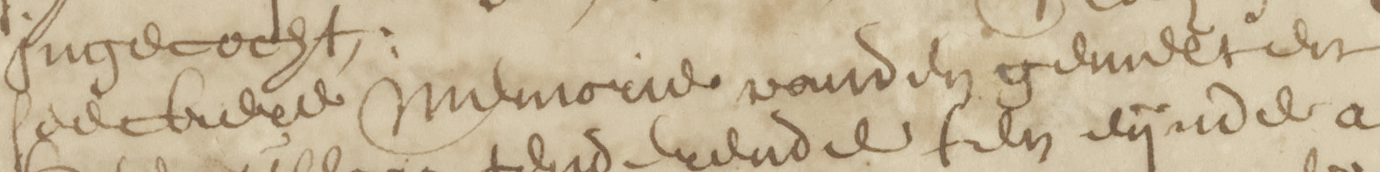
seeckere memorie vanden gemelten
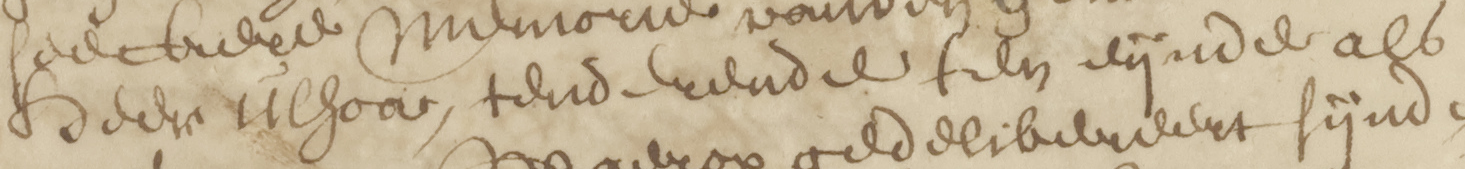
Heer Ulhoa, tenderende ten eijnde als
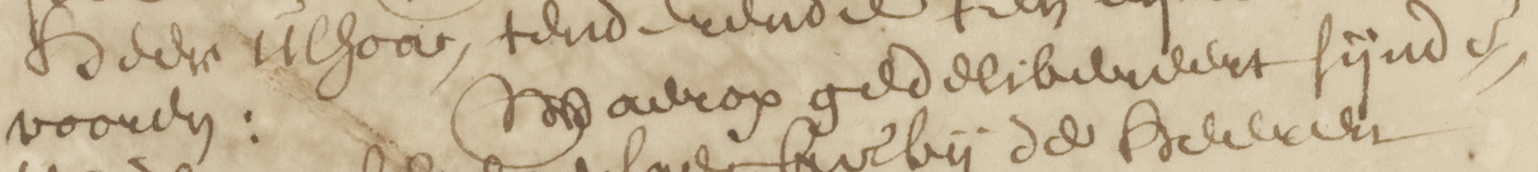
vooren: Waerop gedelibereert sijnde
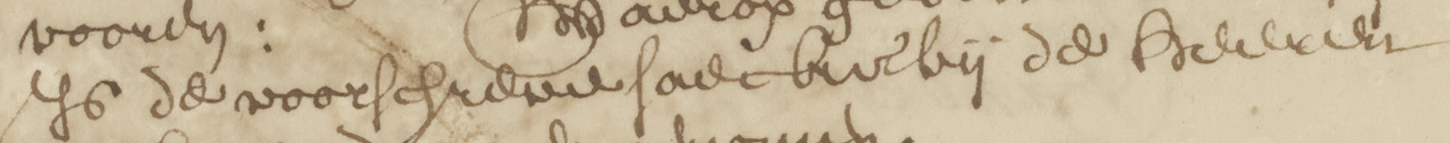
Is de voorschreve saecke bij de Heeren
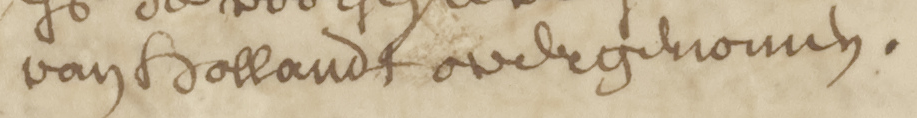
van Hollandt overgenomen.
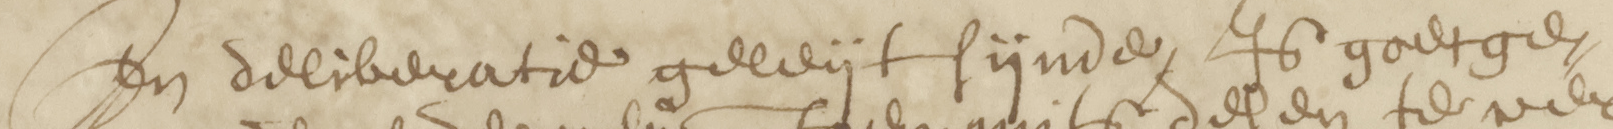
In deliberatie geleijt sijnde, Is goetge„
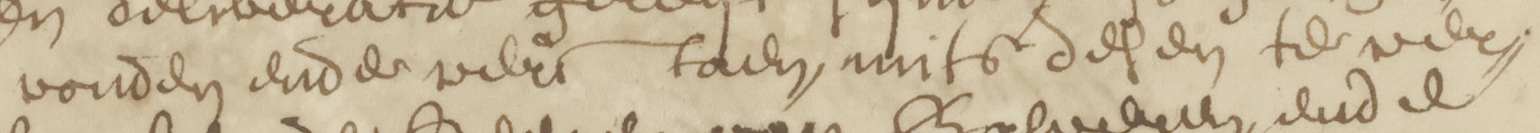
vonden ende verstaen, mits desen te ver,,
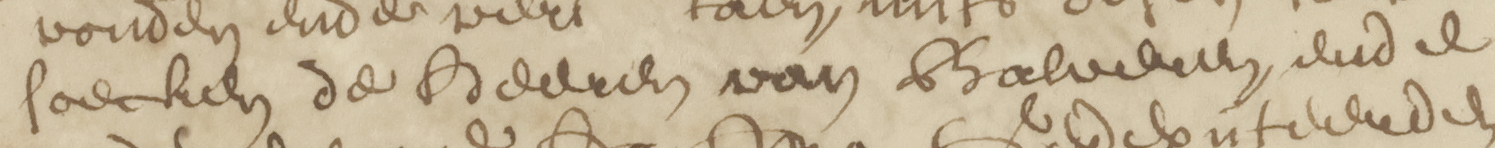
soecken de Heeren van Balveren, ende
